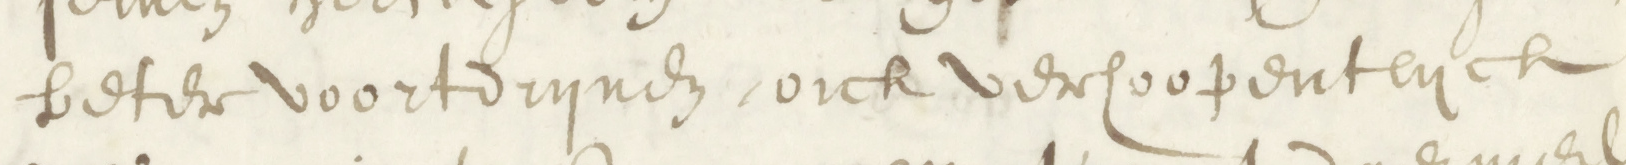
beter voortdryuen, oick verhoopentlijck
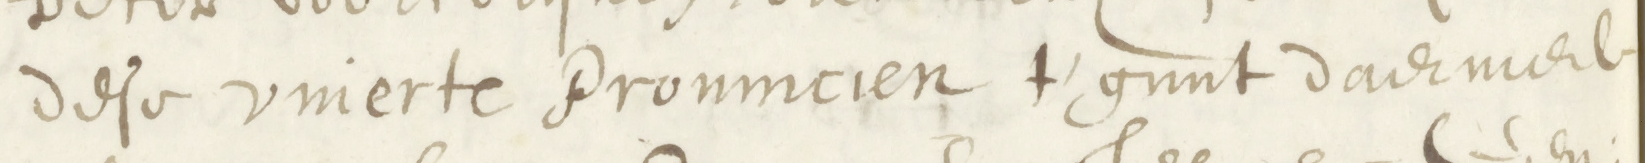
dese vnierte prouincien t'gunt daermede
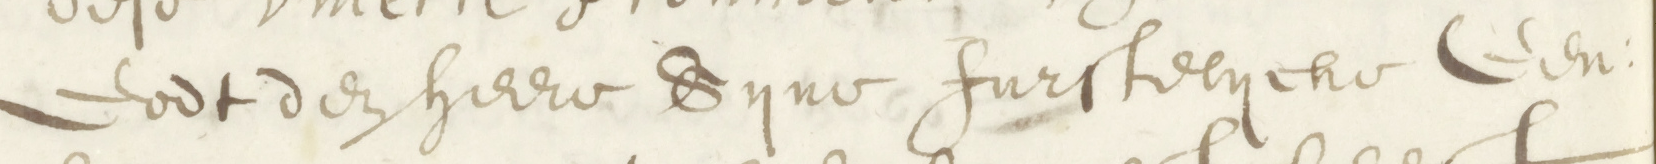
Godt den heere Syne furstelycke Gen:
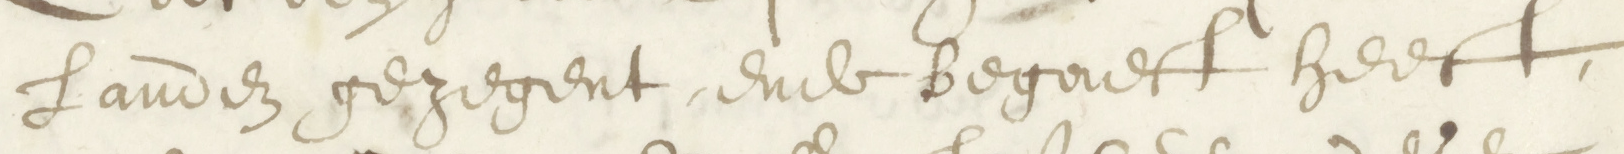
Landen gezegent, ende begaeft heeft,
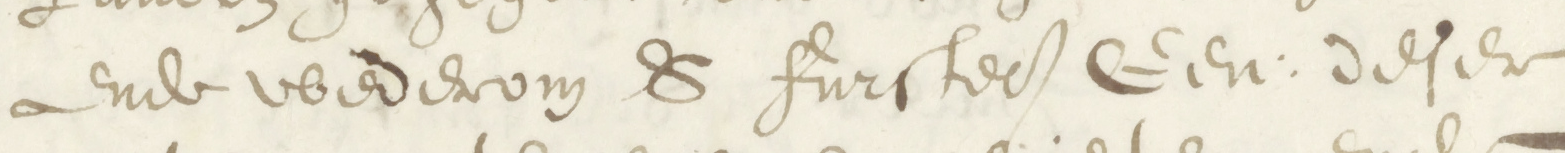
ende wederom S Furstel Gen: deser
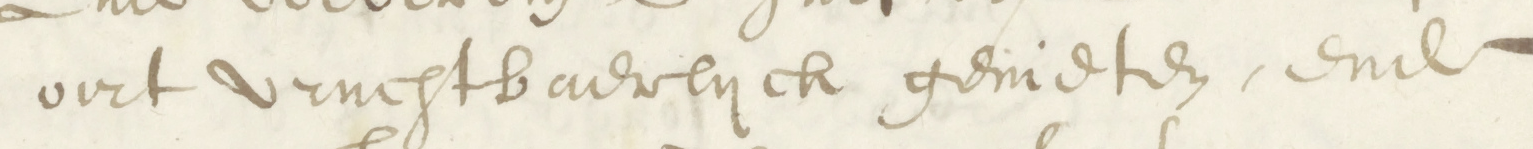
oirt vruchtbaerlyck genieten, ende
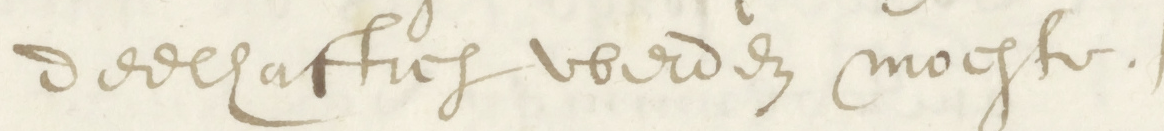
deellastich werden mochte.
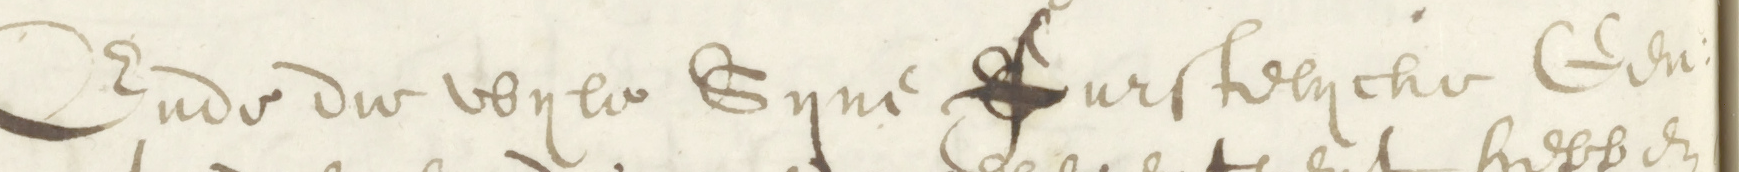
Ende die wyle Syne Furstelycke Gen:
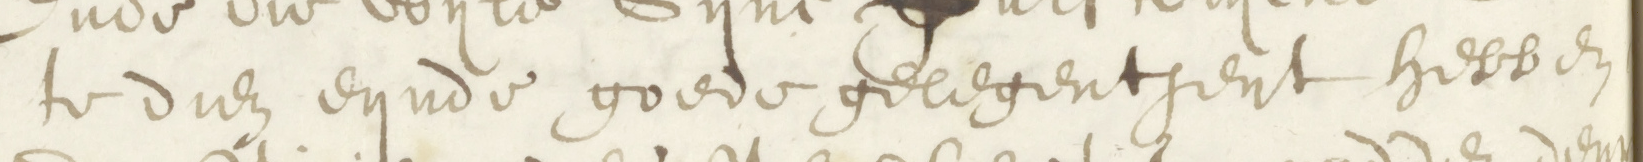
te dien eynde goede gelegentheyt hebben
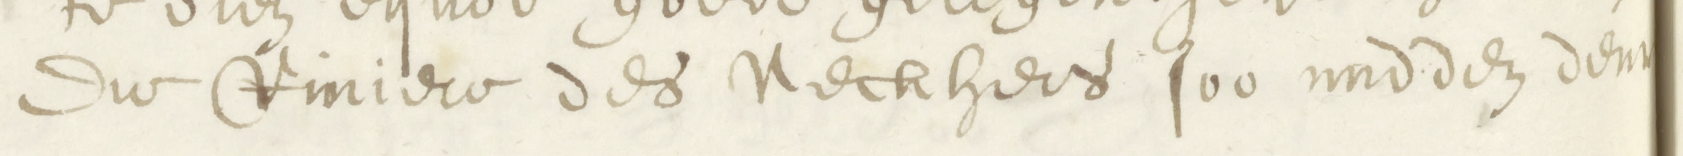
die Riuiere des Neckhers soo midden den
